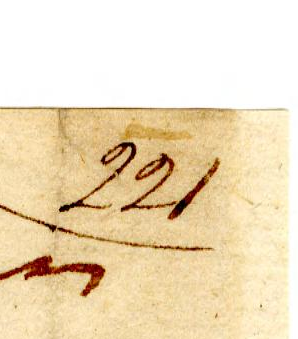221
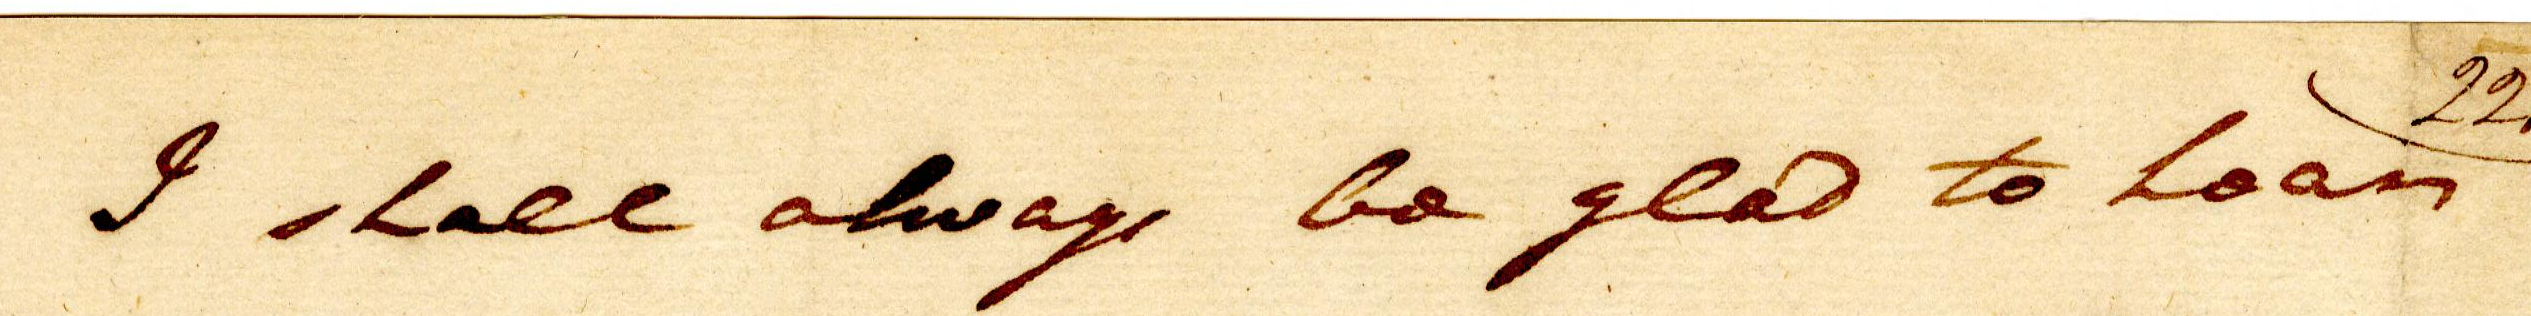I shall always, be glad to learn
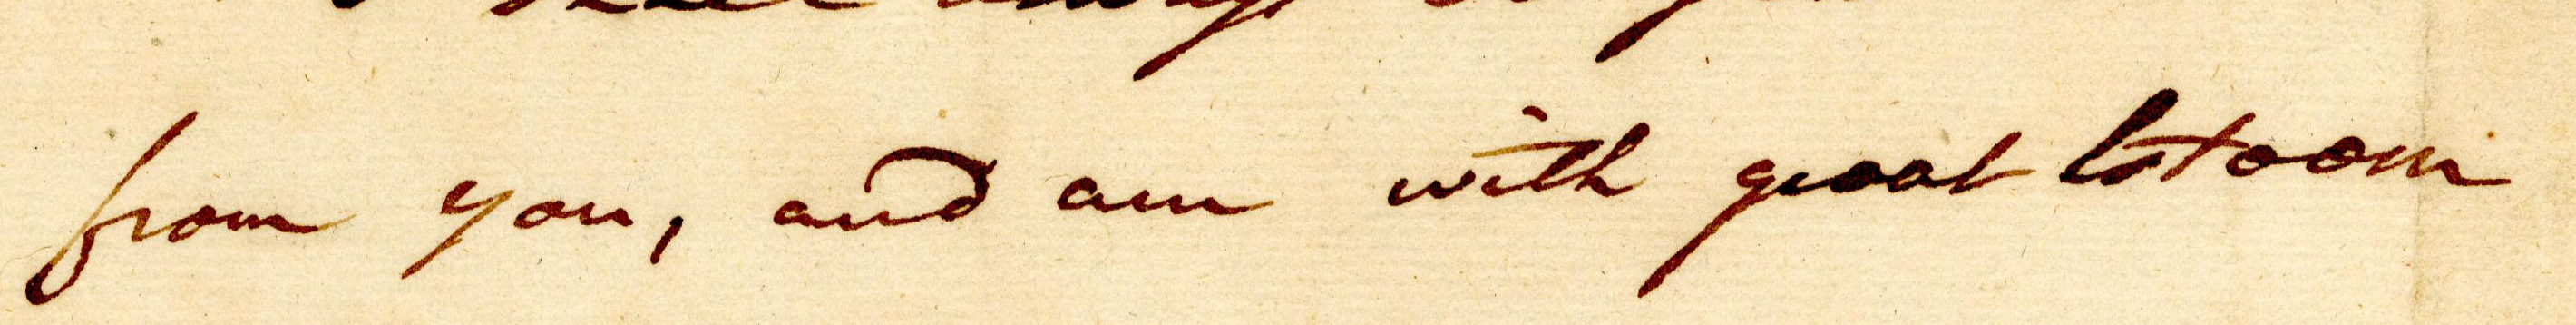from you, and am with great Esteem
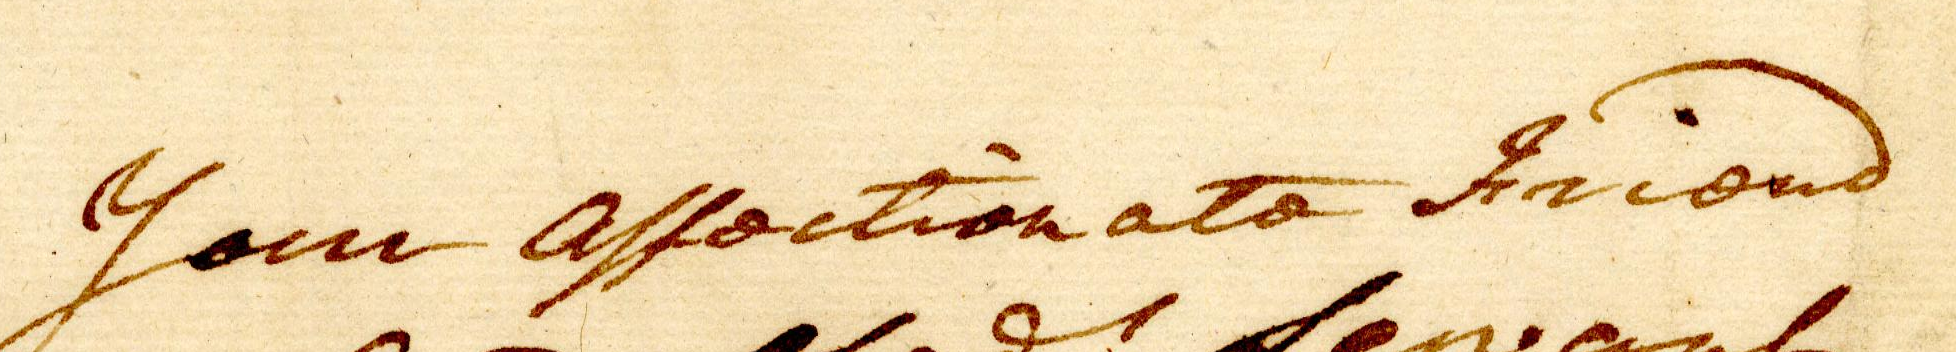Your affectionate Friend
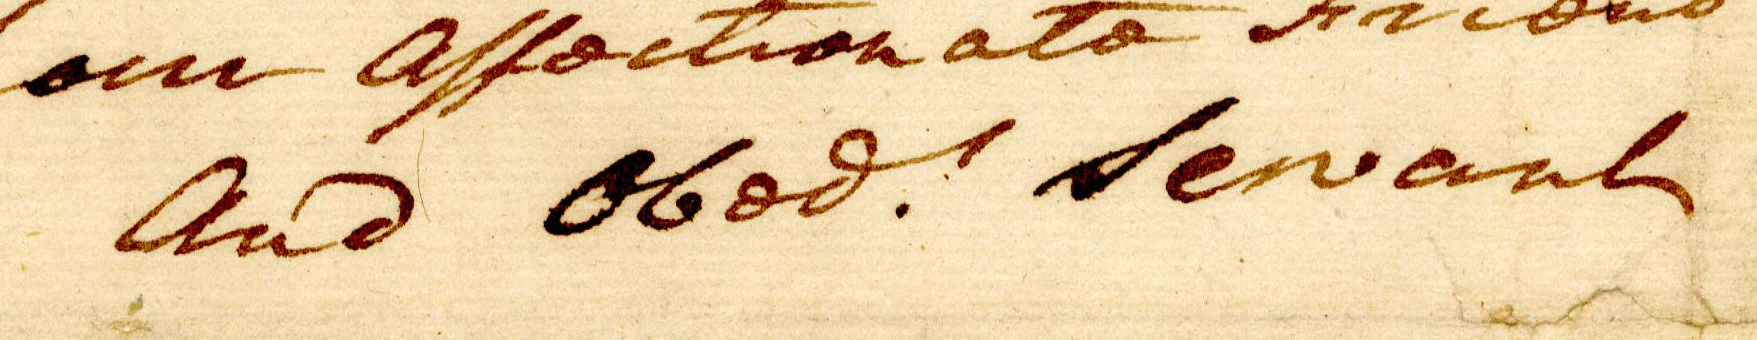And Obed^t servant
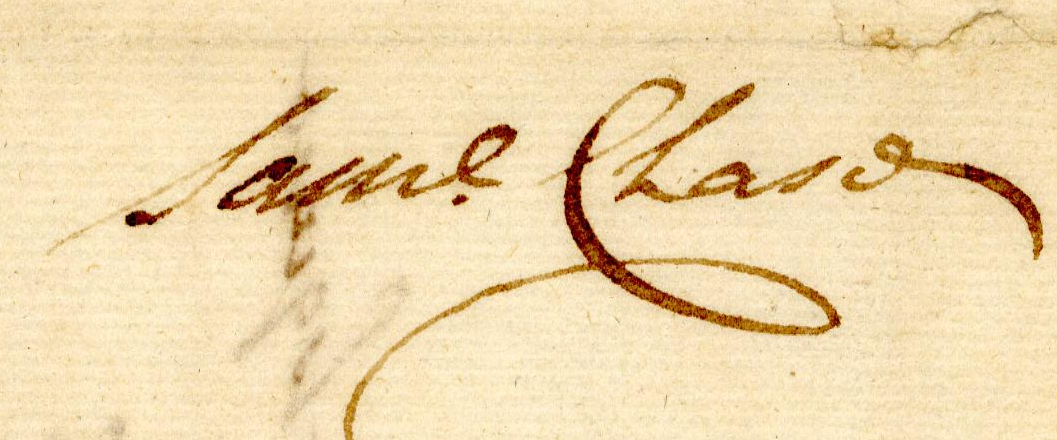Sam^l Chase
